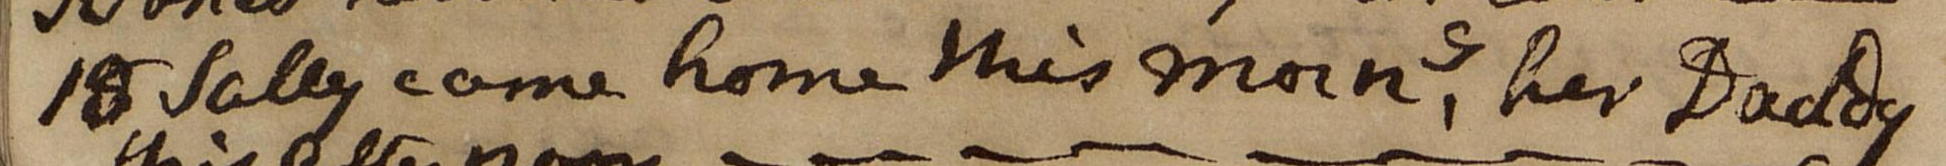18 Sally come home This morn^g. her Daddy
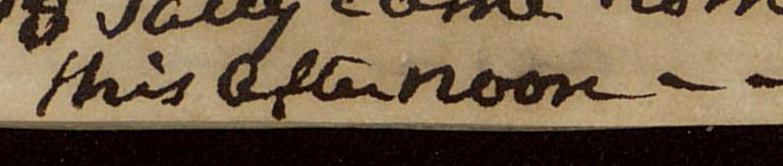this Afternoon-
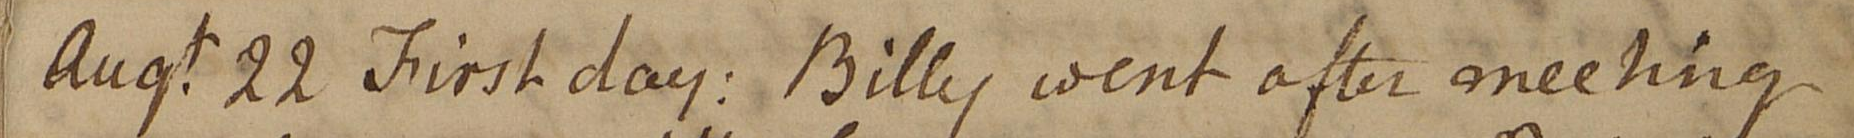Aug^t. 22 First day: Billy went afer meeting
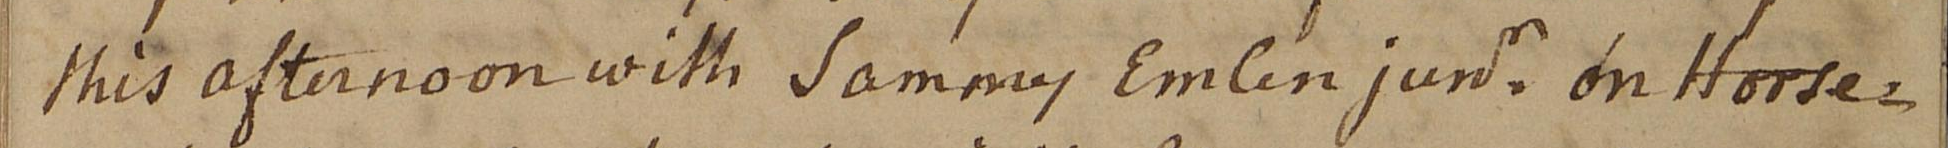this afternoon with Sammy Emlen jun^r. on Horse-
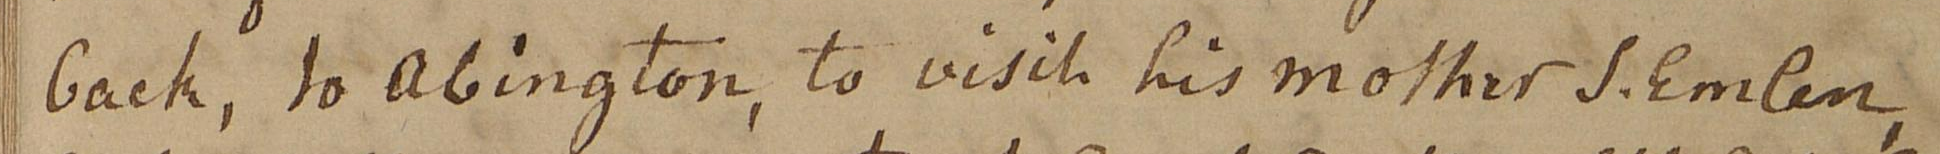back, to Abington, to visit his mother S. Emlen,
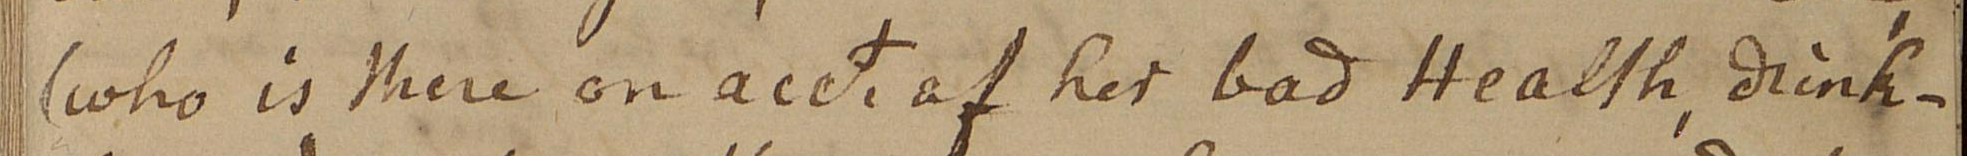(who is there on acc^t. of her bad Health, drink-
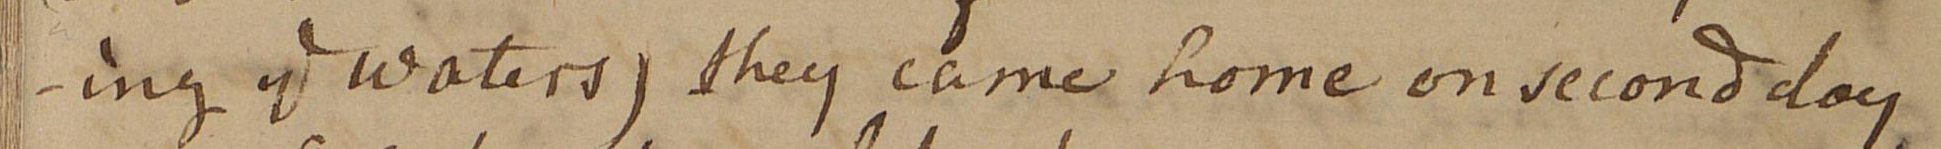-ing y^e waters) they came home on second day
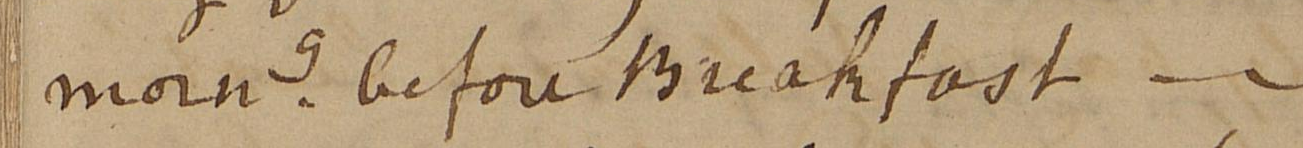morn^g. before Breakfast-
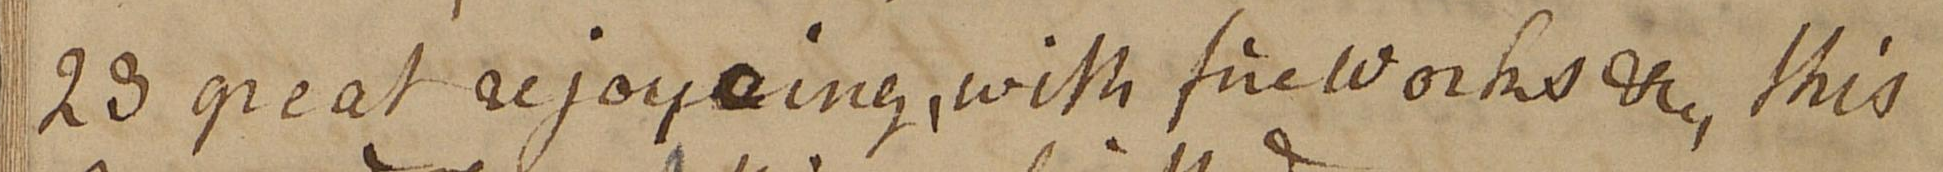23 great rejoycing, with fire works &c, this
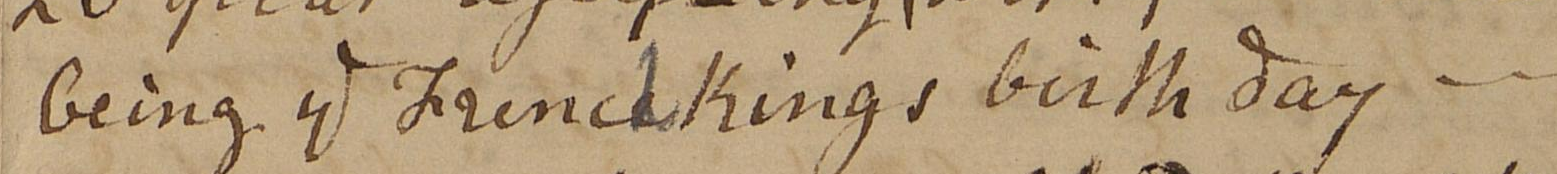being y^e FrenchKings birth day-
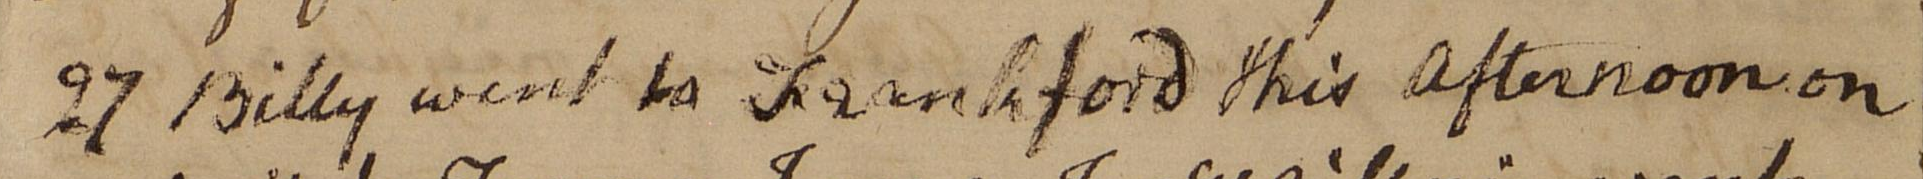27 Billy went to Frankford this Afternoon on
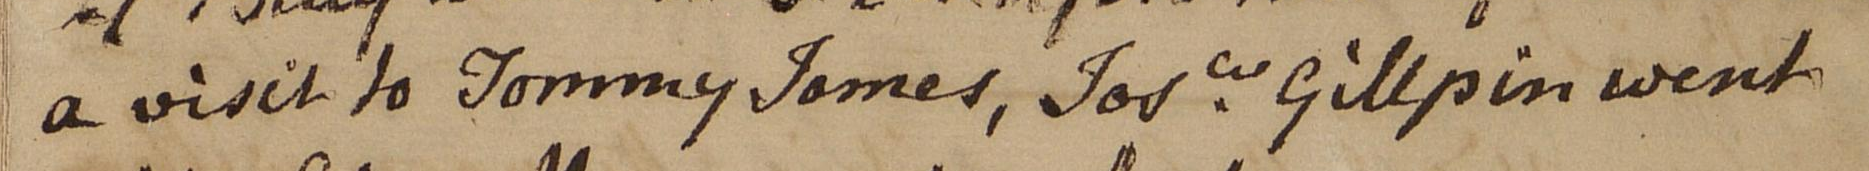a visit to Tommy James, Jos^a. Gillpin went
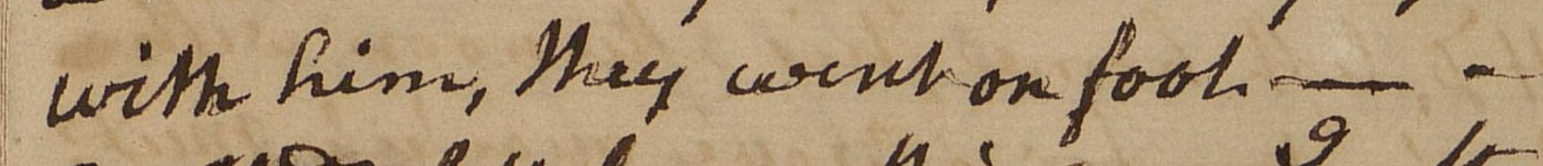with him, they went on foot---
